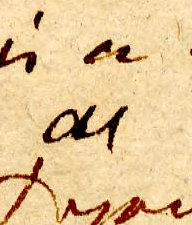as
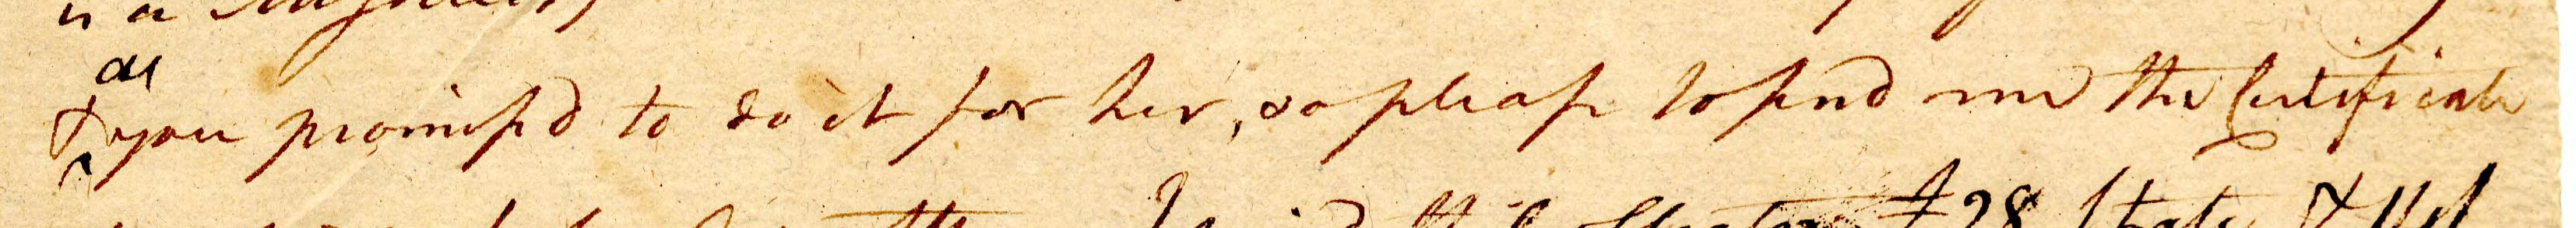& ^ you promisd to do it for her, so please to send me the Certificate
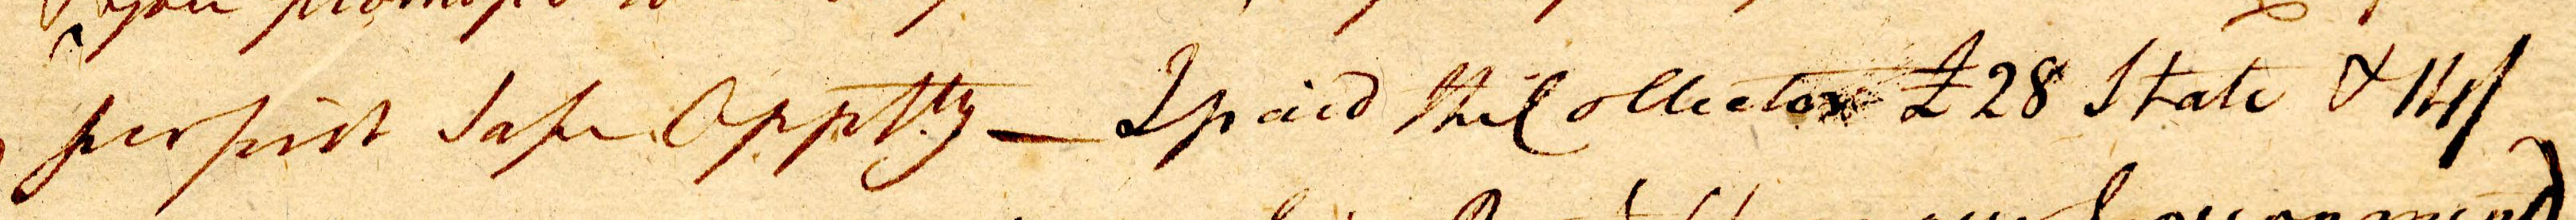per first safe Oppt^ty.- I paid the Collector £28 State & 14s
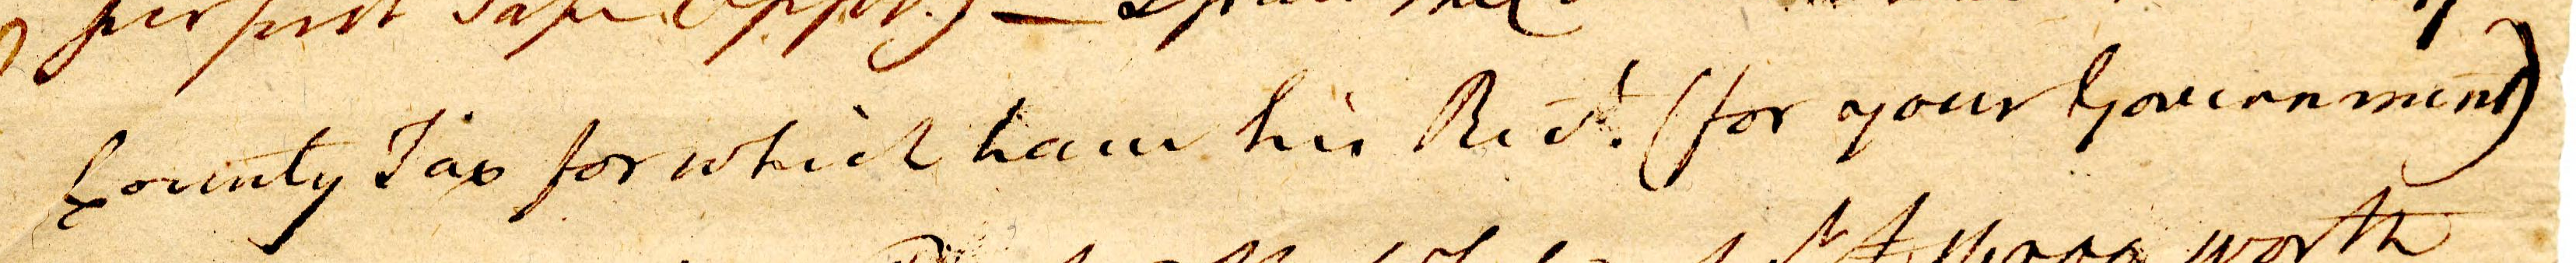County Tax for which have his Rec^t. for your Government)
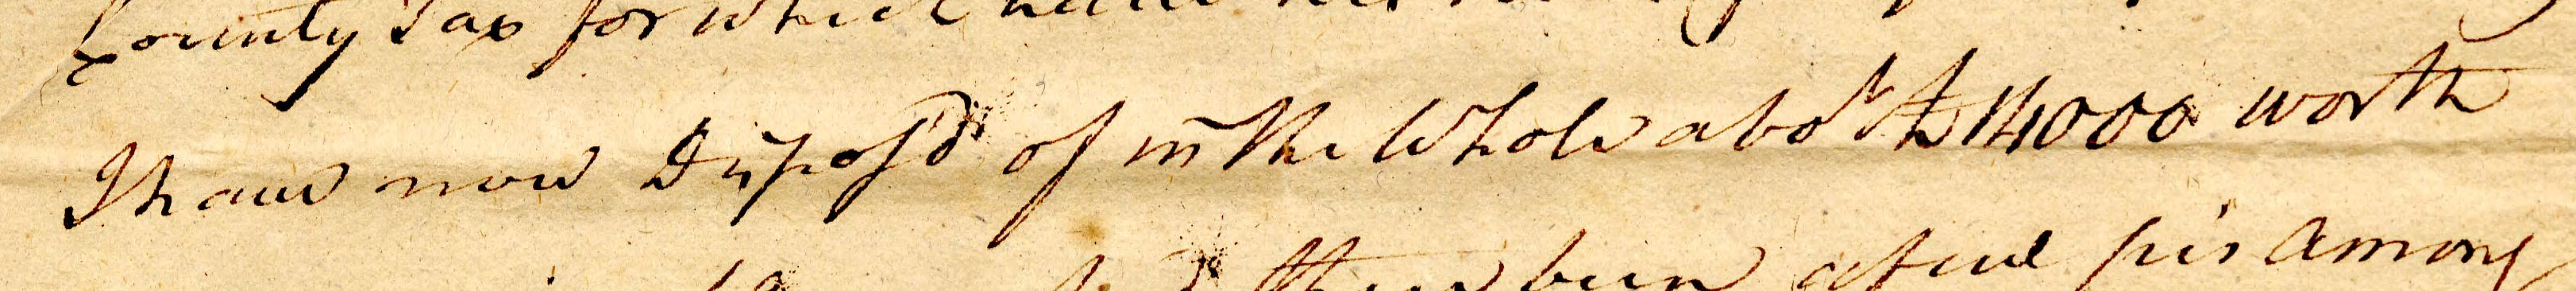I have now disposd of in the Whole abo^t £14000 worth
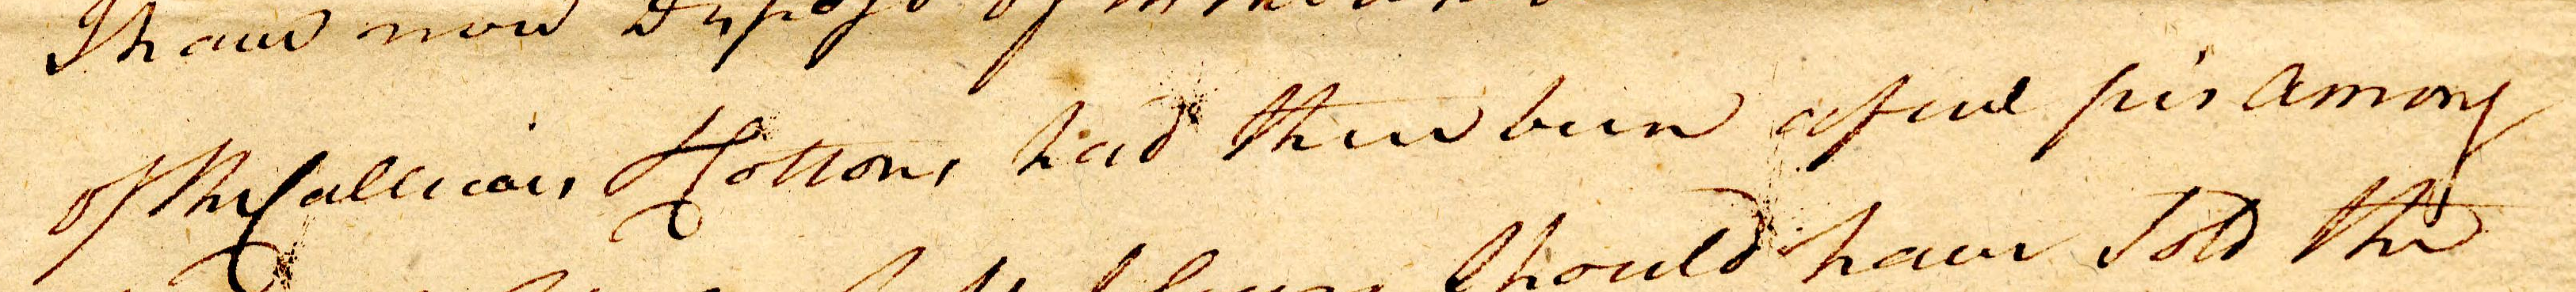of the callicoes & Cottons had these been a few pis amory
